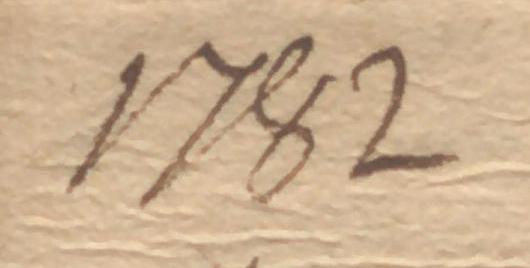1782
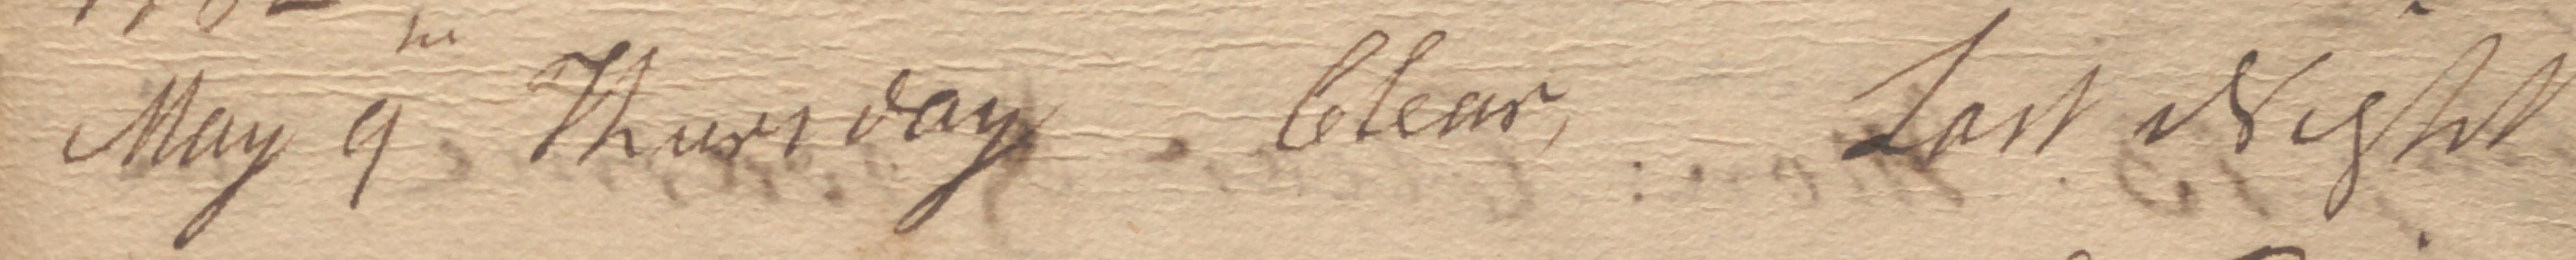May 9^th Thurs day Clear Last Night
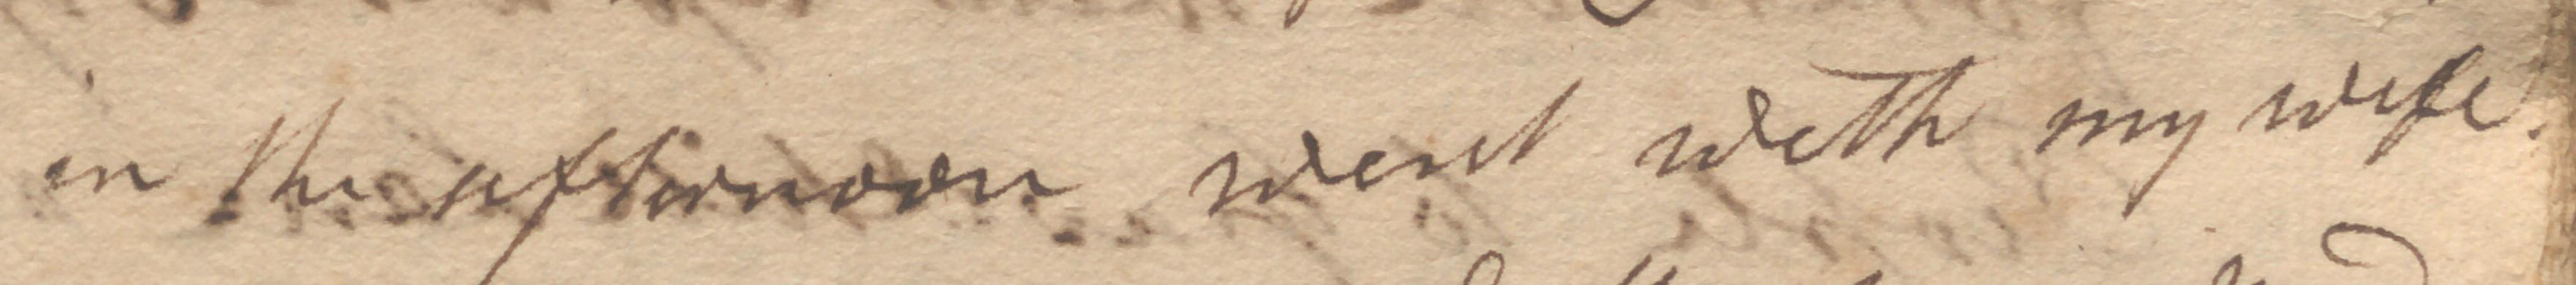in the afternoon went with my wife
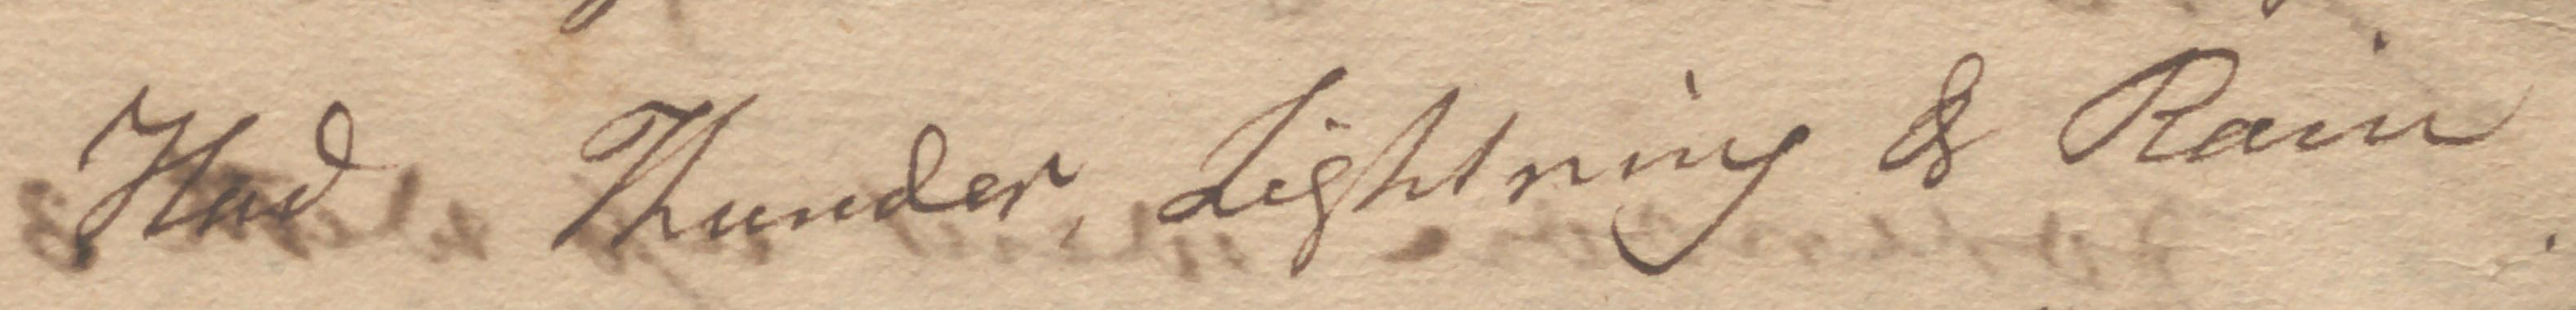Had. Thunder, Lightning & Rain
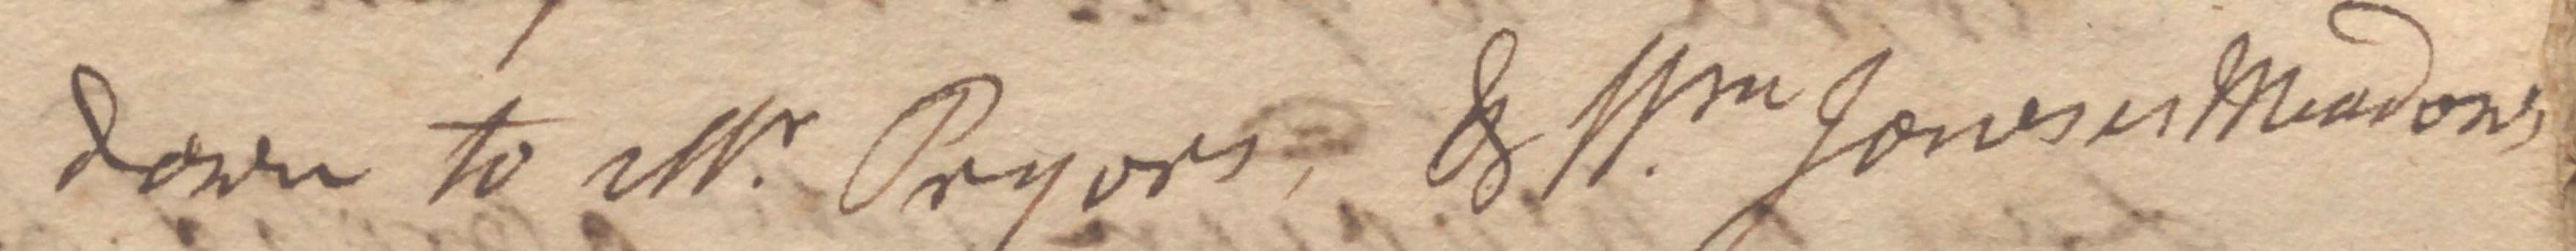down to M^r. Pryors & W^m. Joneses Meadow
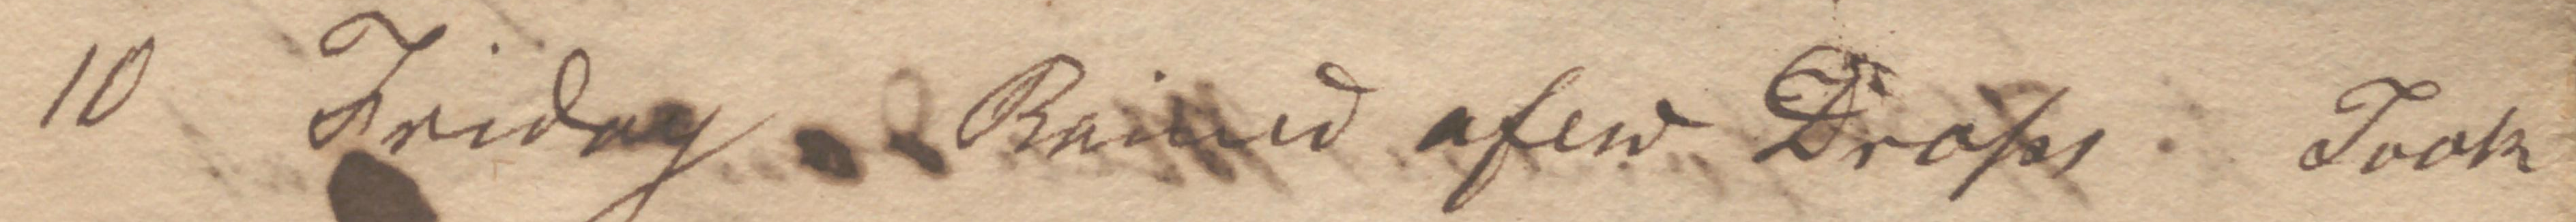10 Friday Rained a few Dropes. Took
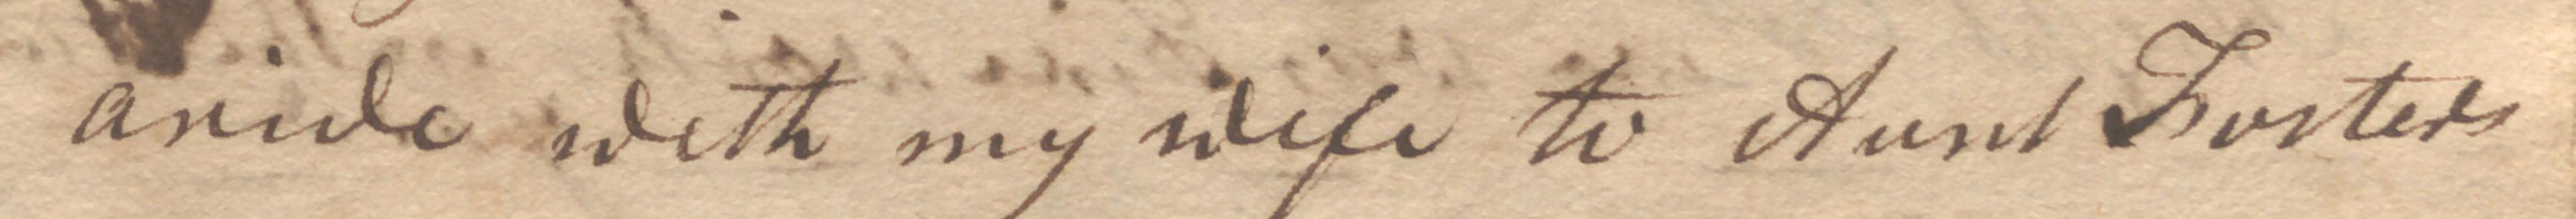a ride with my wife to Aunt Fosters
